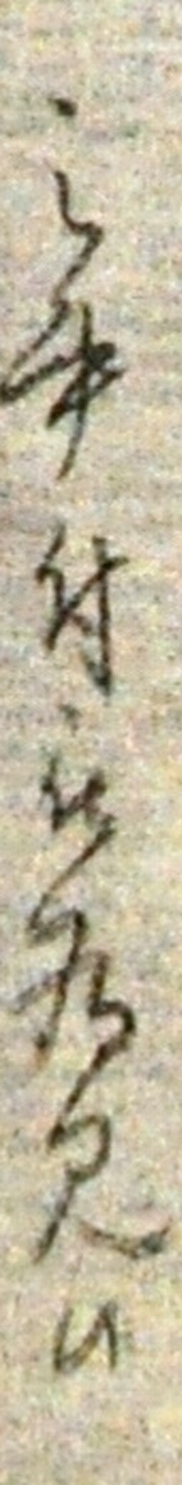之書付被為見候
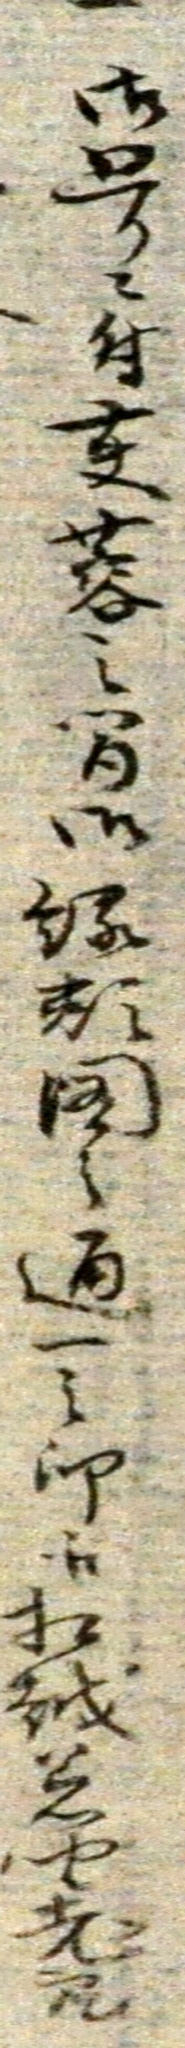一御廻りニ付芙蓉之間御縁頬図之通一之印え相越着坐老衆

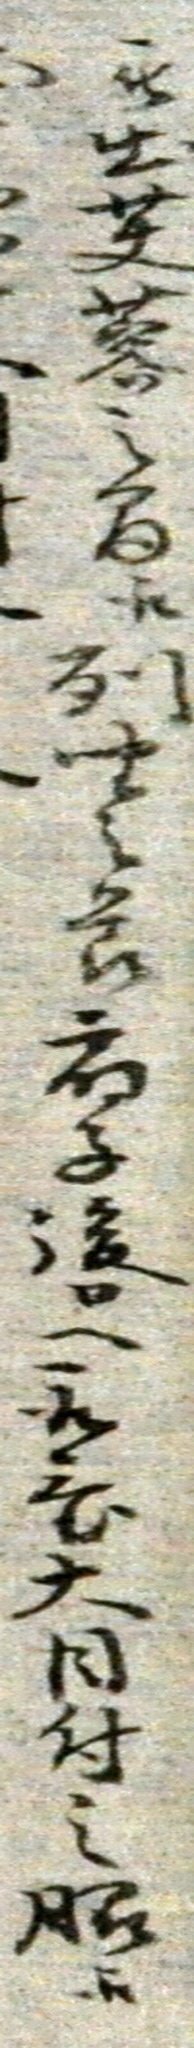被出芙蓉之間え列坐之節扇子後ロへ取置大目付之脇え
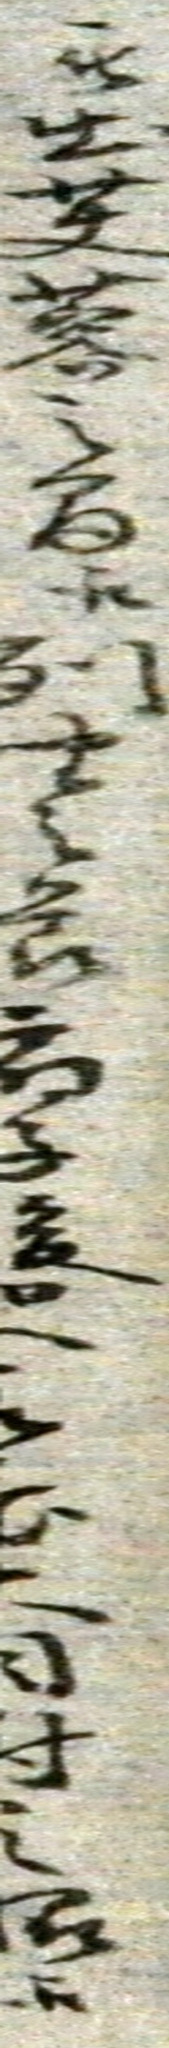被出芙蓉之間え列坐之節扇子後ロへ取置大目付之脇え
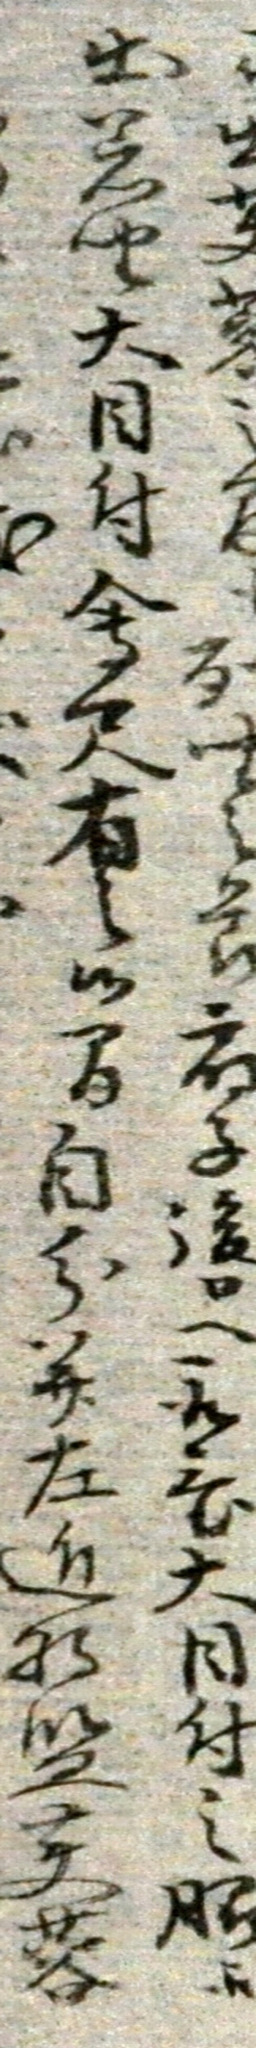出着坐大目付会尺有之候間自分并左近将監芙蓉
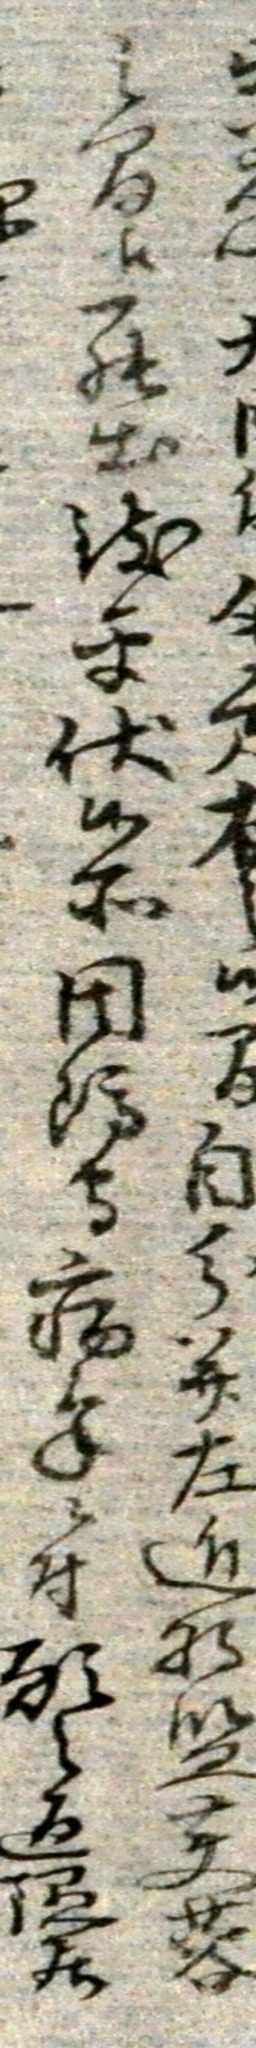之間え罷出致平伏候所周防守病気ニ付願之通隠居
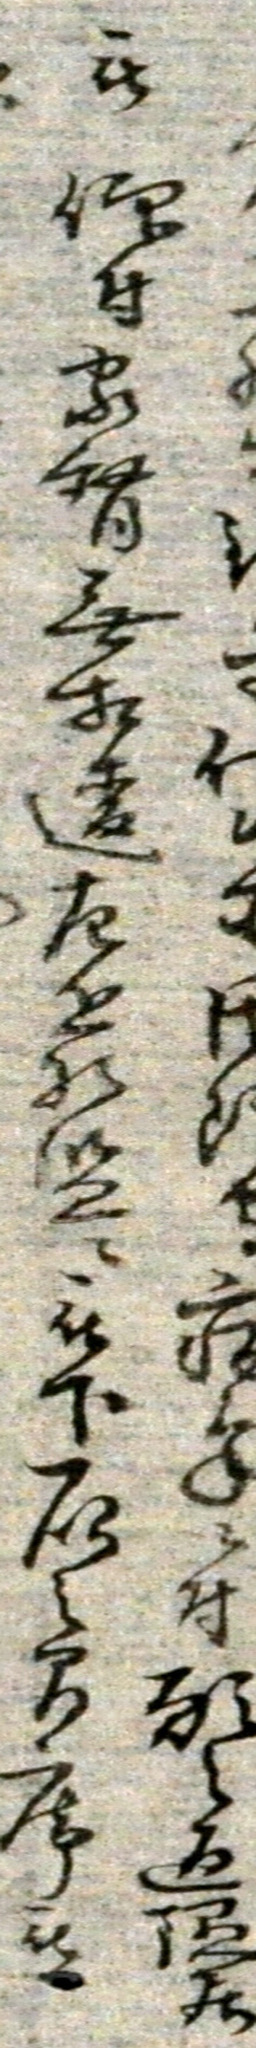被仰付家督無相違左近将監ニ被下雁之間席被
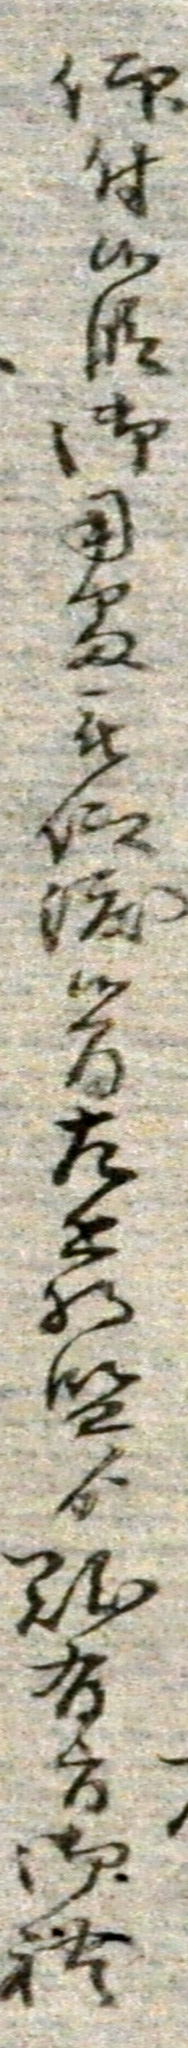仰付候段御用番被仰渡候間左近将監ゟ難有旨御礼
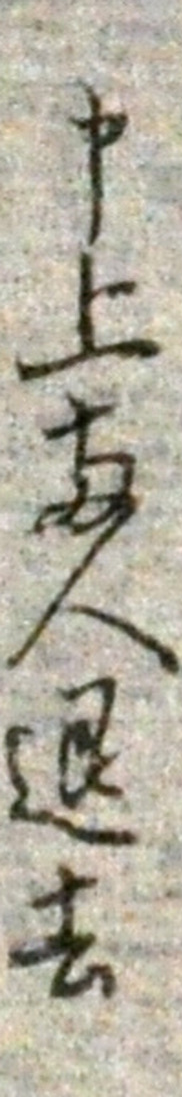申上両人退去
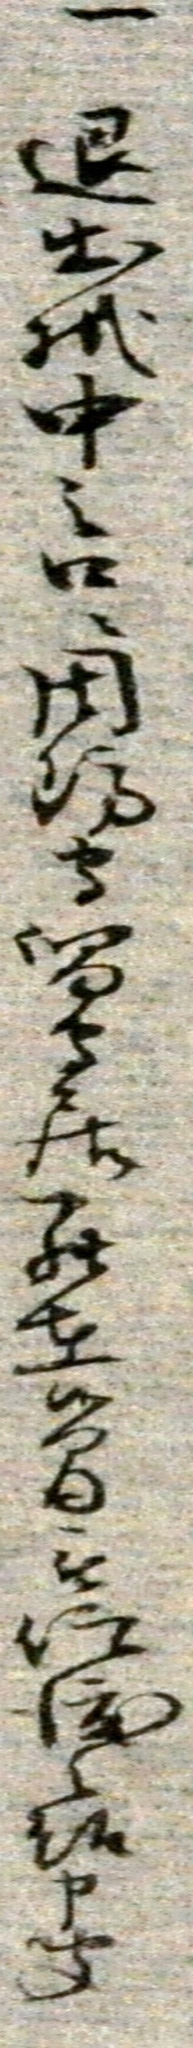一退出掛中之口ニ周防守留守居罷在候間被仰渡之趣申聞
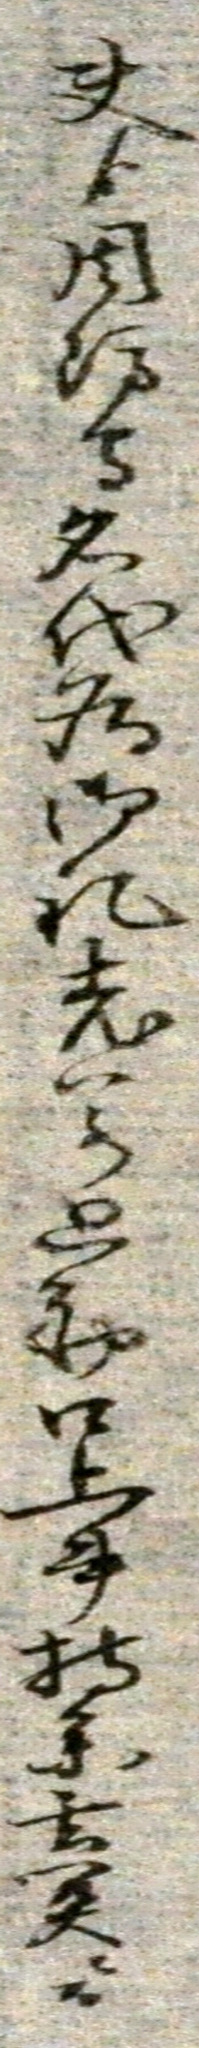夫ゟ周防守名代為御礼老若廻勤口上書持参玄関ニ而
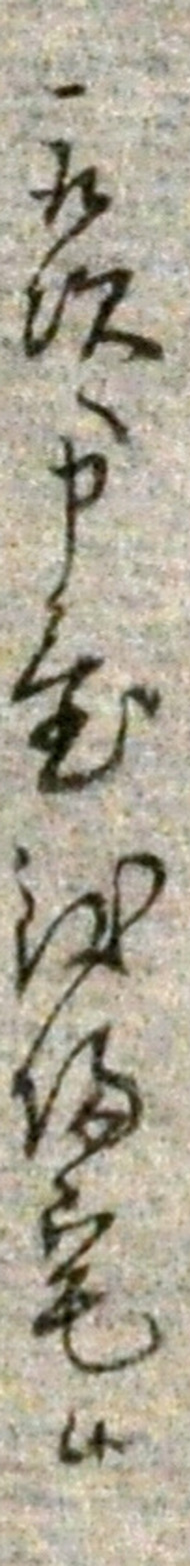取次へ申置致帰宅候
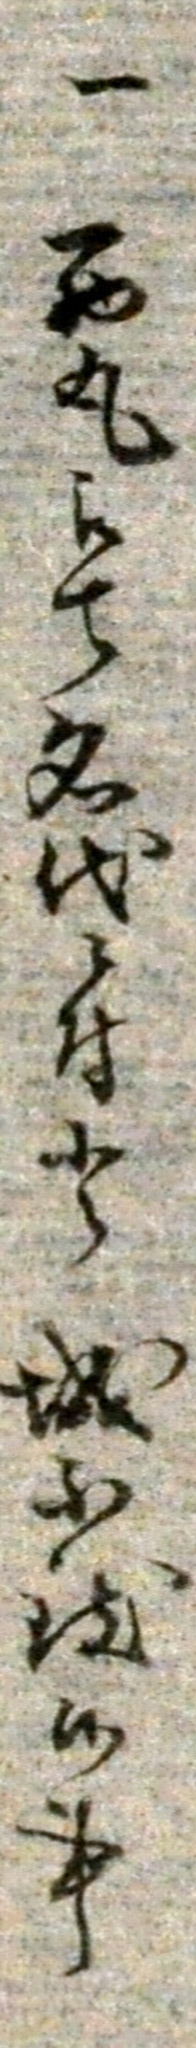一西丸えは名代ニ付登城不致候事
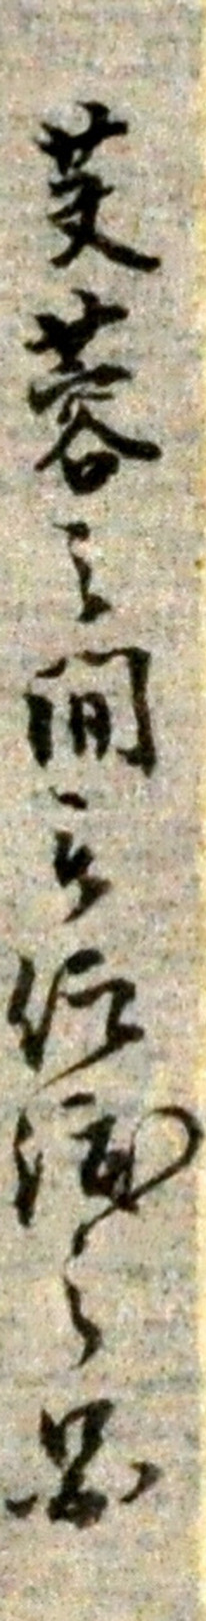芙蓉之間被仰渡之図
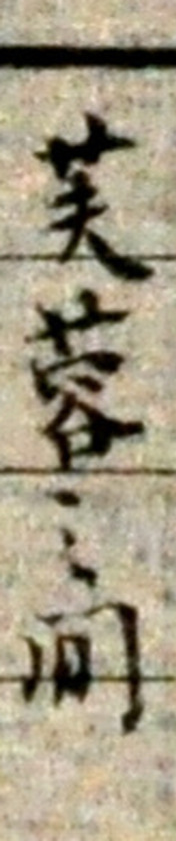芙蓉之間
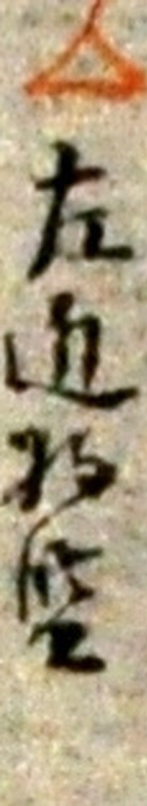△左近将監
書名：諸名代相勤候節ノ留書外
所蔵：伊那市立高遠町図書館・合同会社AMANE
